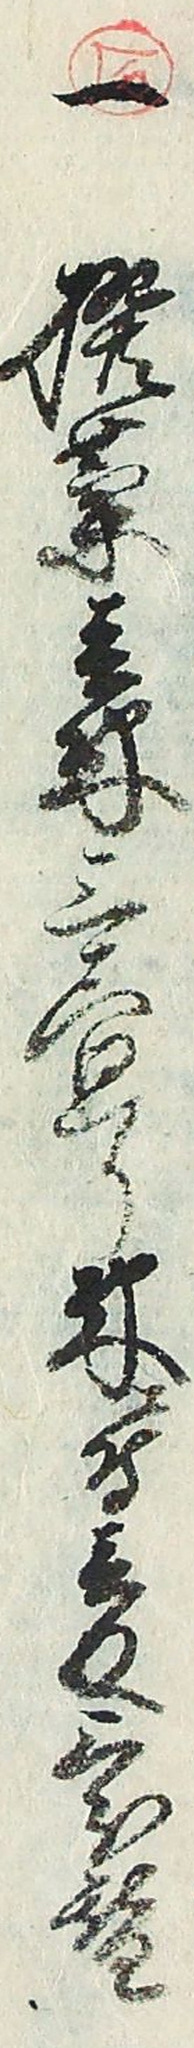一撰藁一束三尺廻り束に付一匁三分替
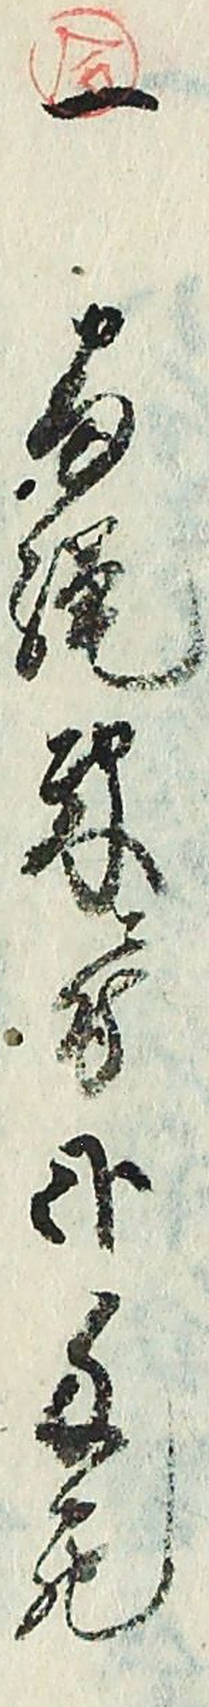一番縄束に付二匁宛
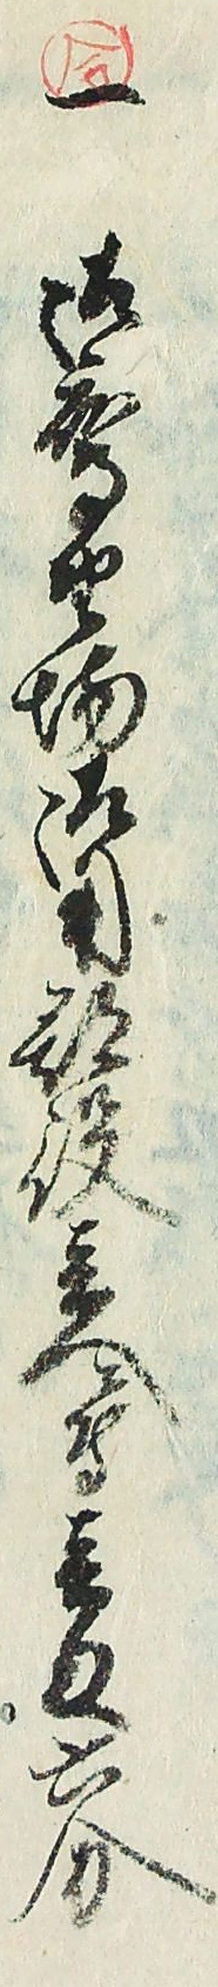一御鷹野場御用郡役一人に付一匁六分
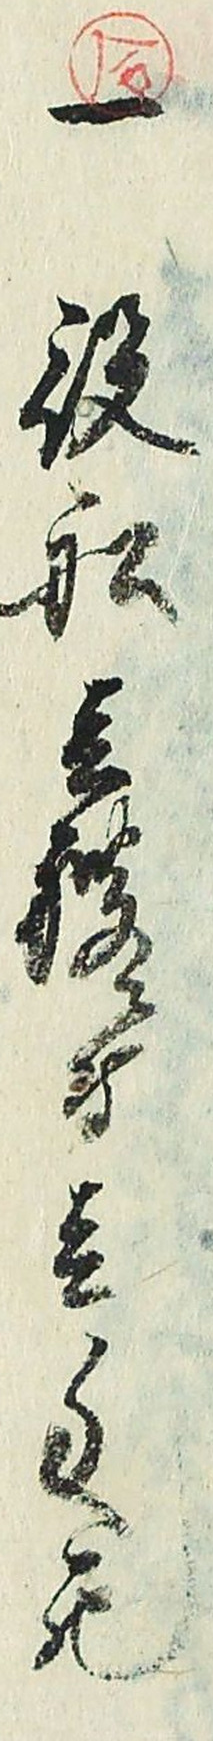一役船一艘に付一匁宛
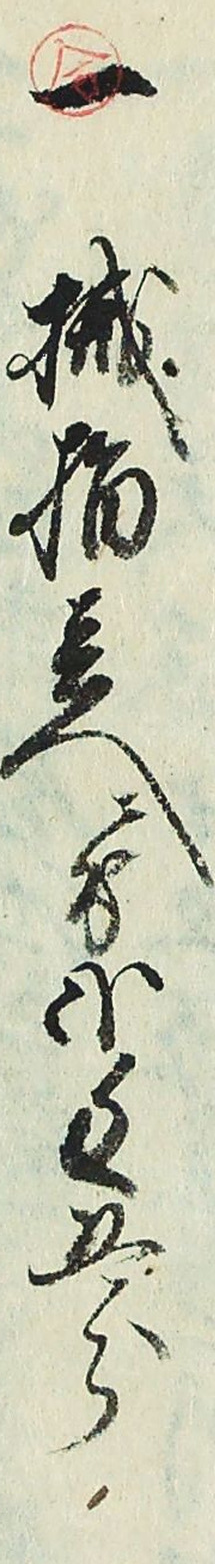一械指一人に付二匁五分
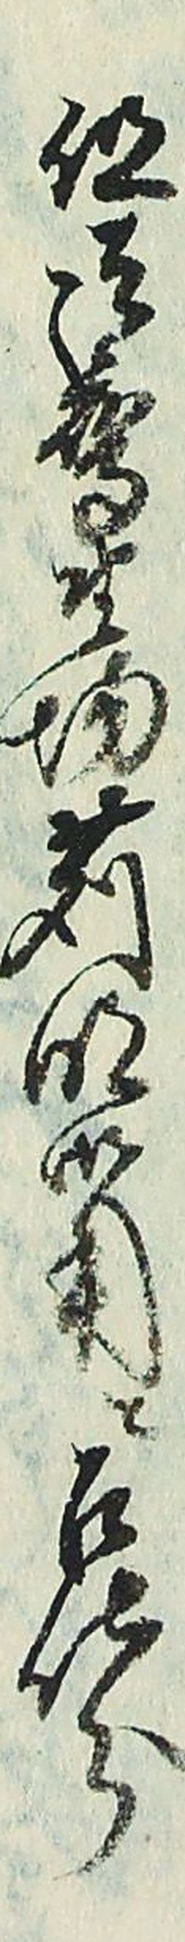但御鷹野場苅明御用に召仕分
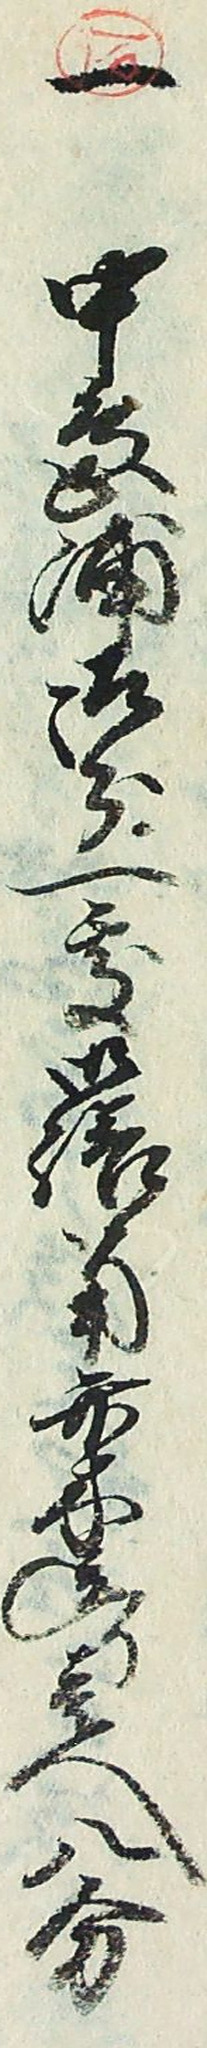一中島浦御分一処御繕御用竹木送り一人八分
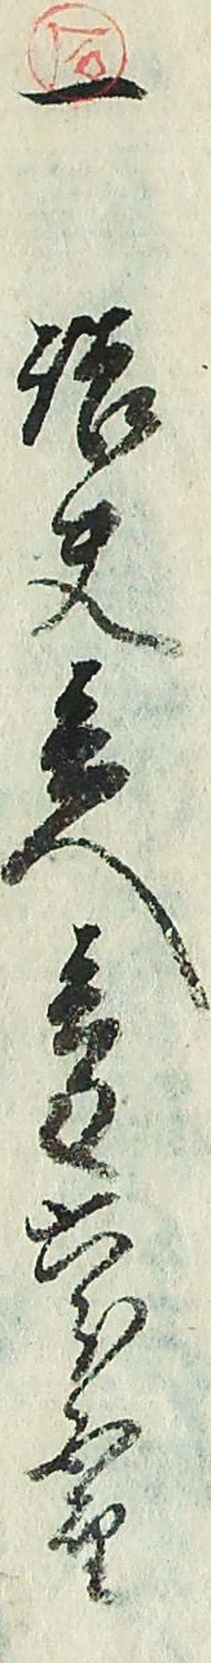一詰夫一人一匁六分五厘
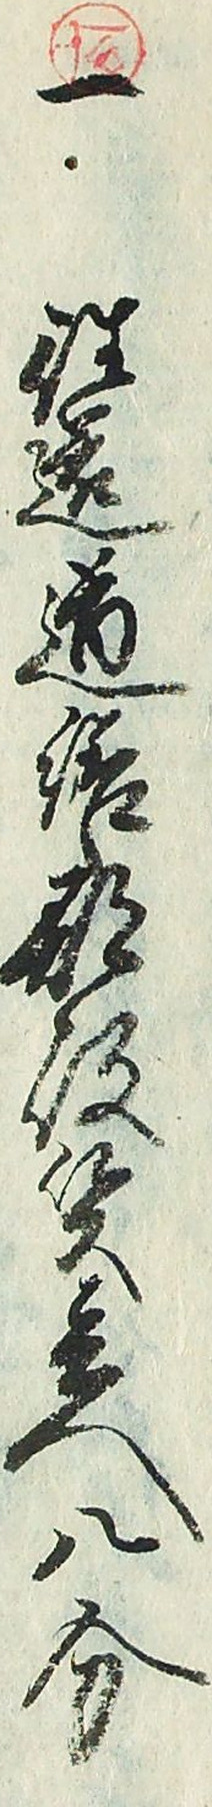一往還道繕郡役賃一人八分
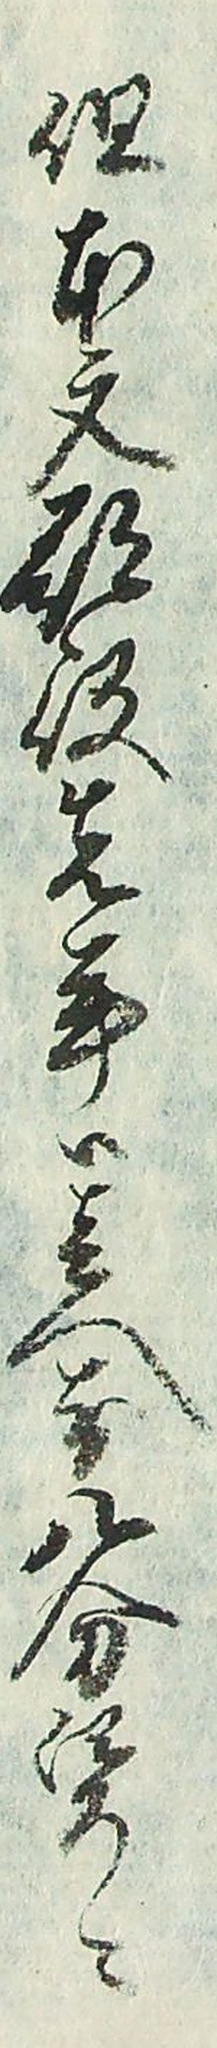但本文郡役先年は一人前八分賃に

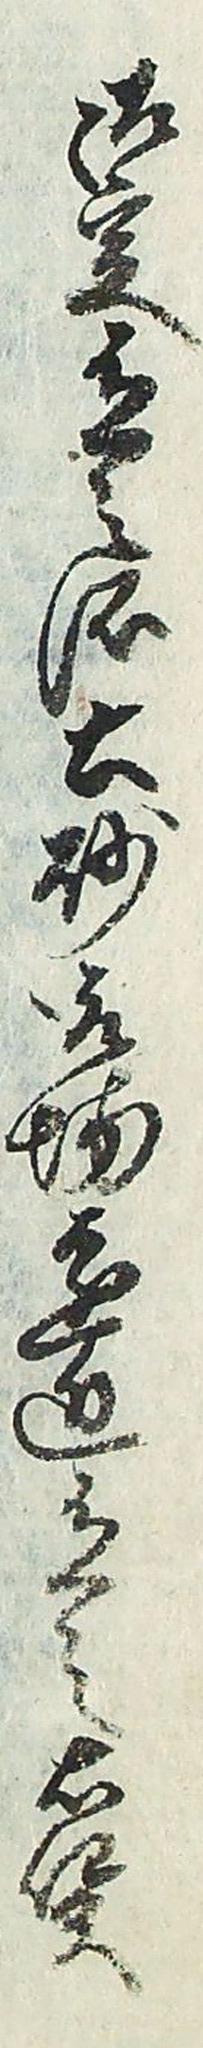御定有之候所土砂取場遠近有之右賃
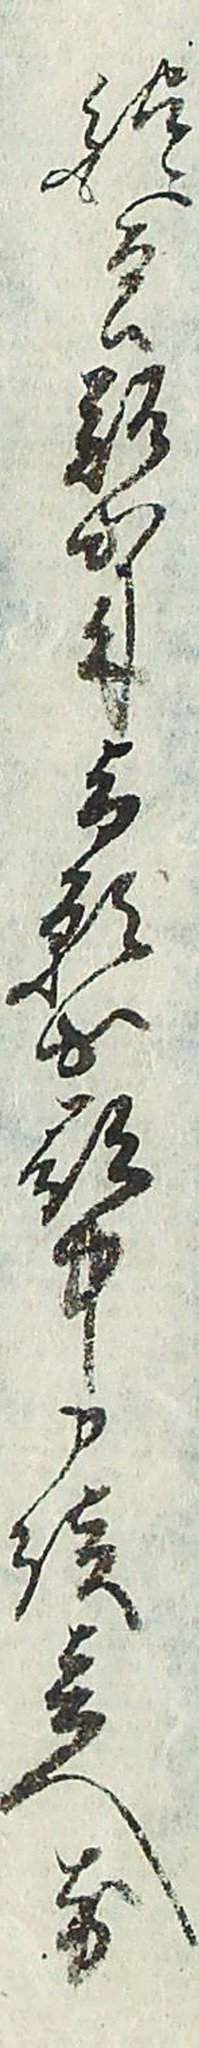銀にては難出来旨願出郡中申談一人前
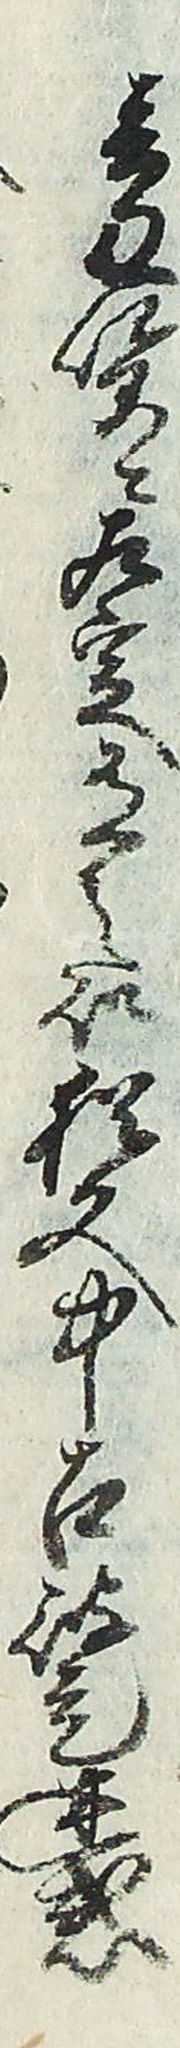一匁賃に相定有之候処猶又中古彼是迷惑
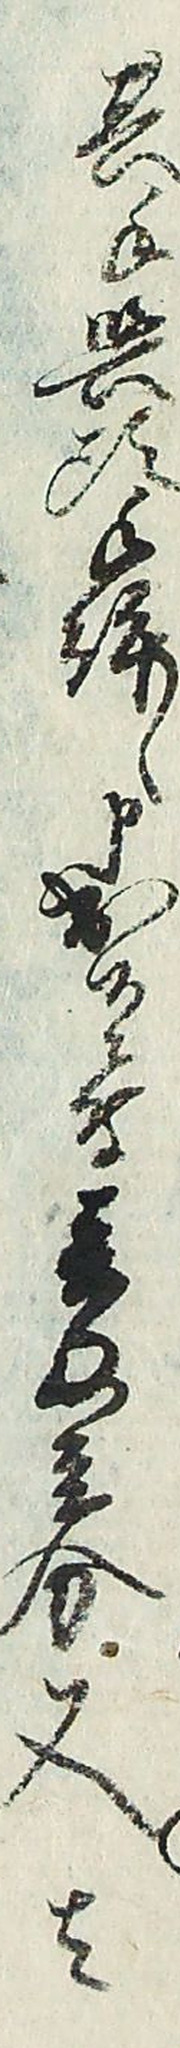其手与頭手許へ申出候に付一匁一分又は
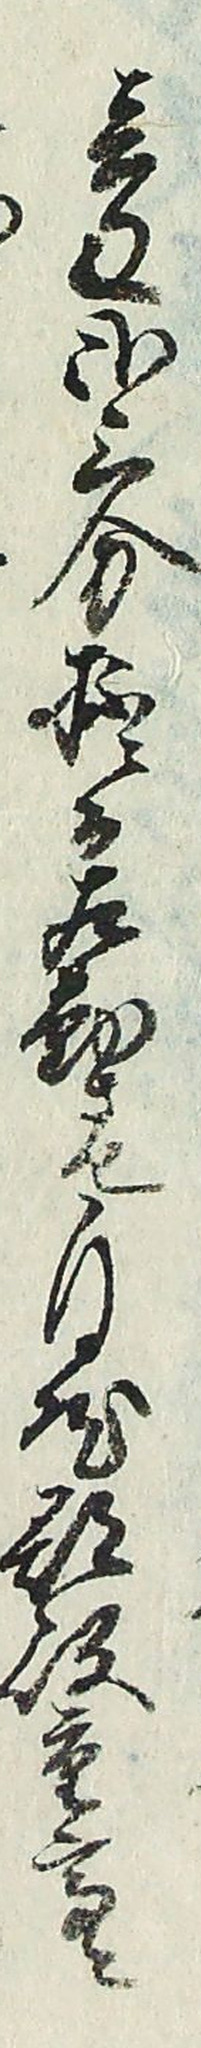一匁二三分抔にて相勤させ自然郡役重高と
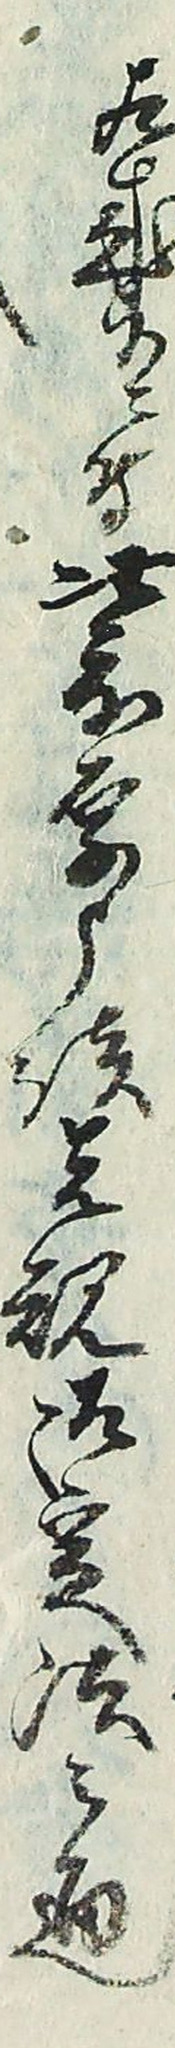相成候に付此度厚申談先規御定法の通
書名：諸割賦物賃銀定記録帳
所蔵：鳴門教育大学 Naruto University of Education
